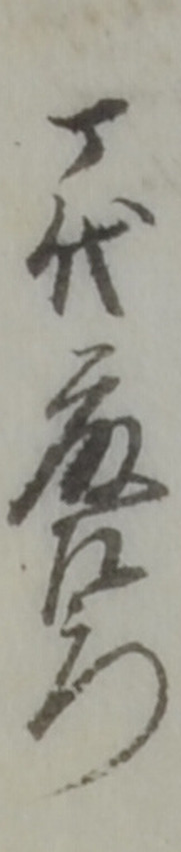丁代藤左衛門
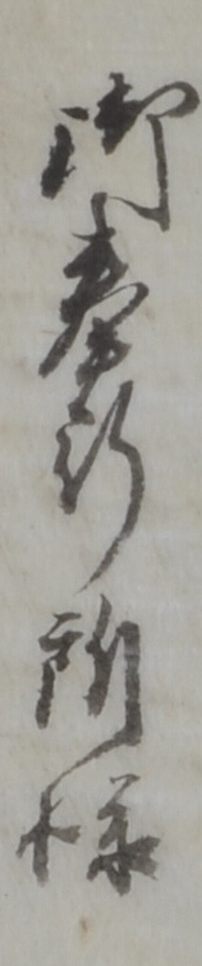御奉行所様
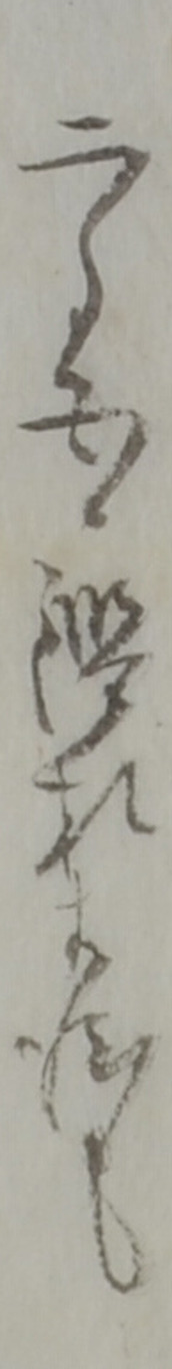二月五日鑑札相渡申候
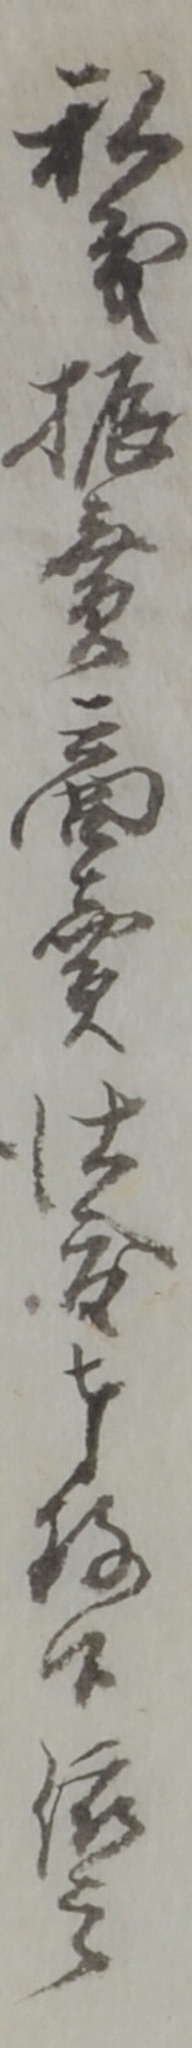私義振売商売仕度奉存候依之
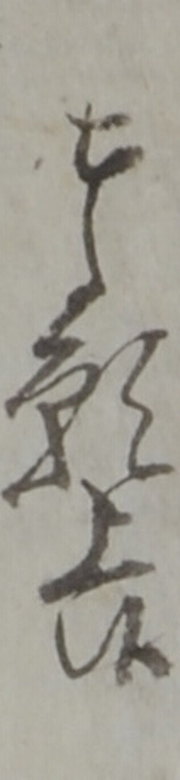奉願上候
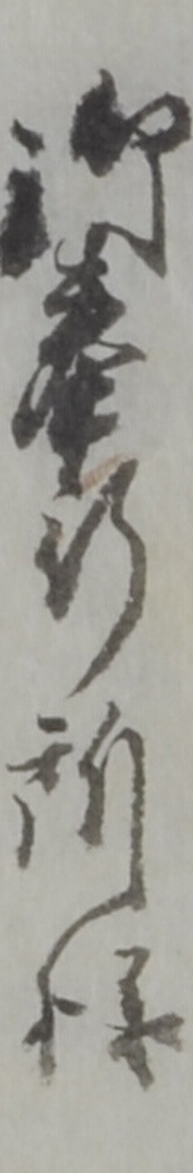御奉行所様
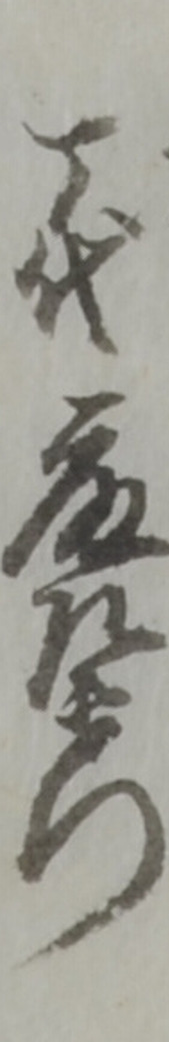丁代藤左衛門
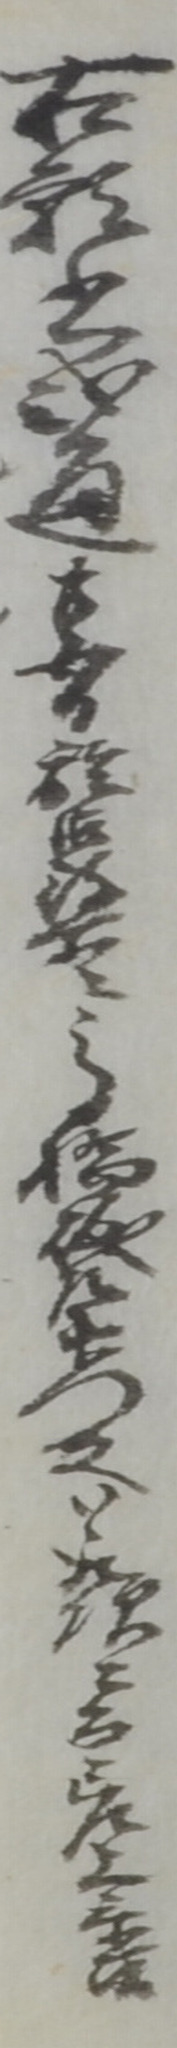右願書弐通廿五日於御役所二高橋磯左衛門殿御取次ニ而差上置候
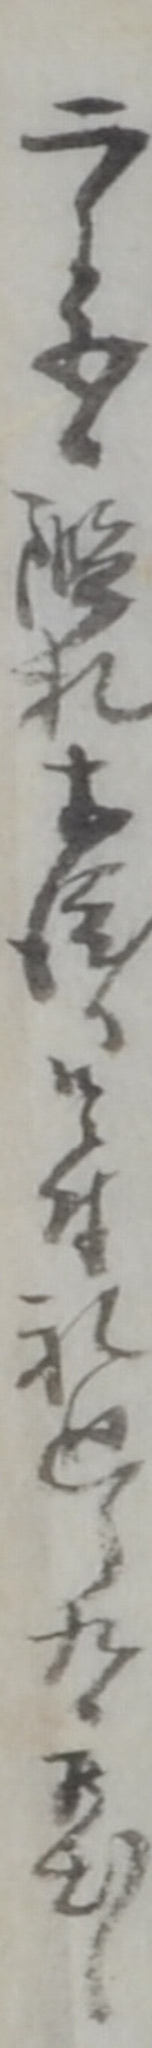二月五日鑑札相渡り候ニ付礼廻り九日罷出候

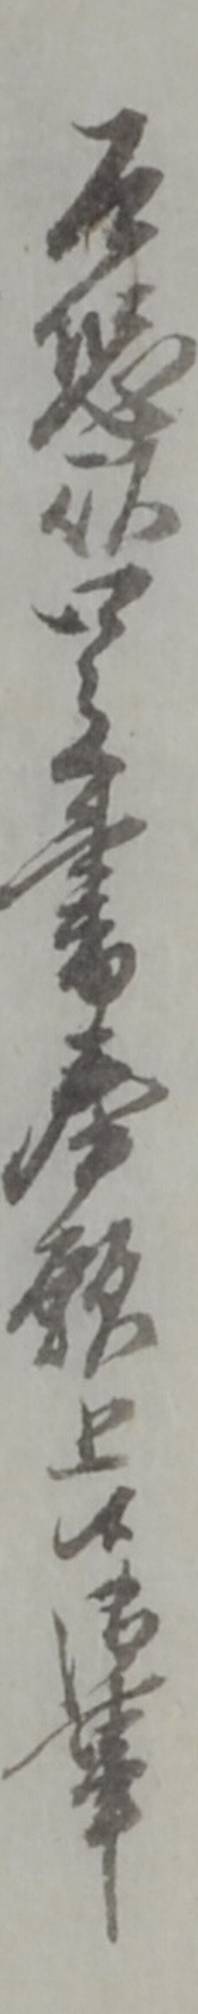乍恐以口上書奉願上候御事
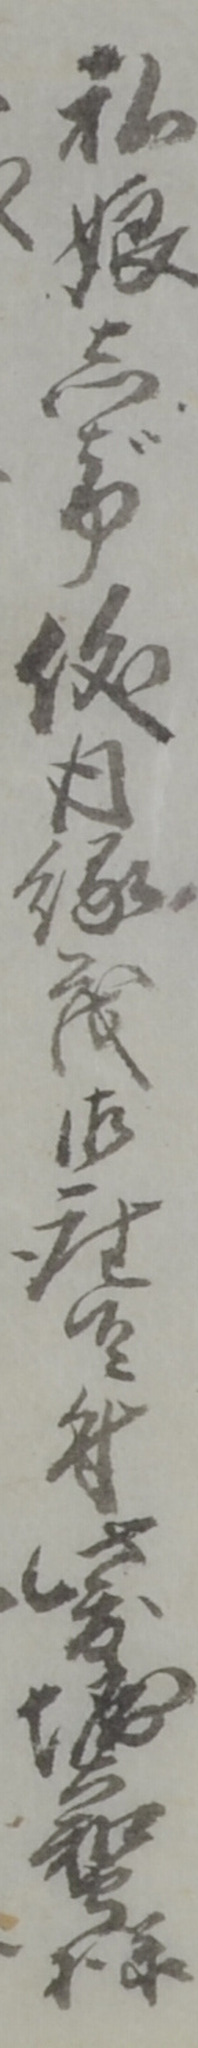私娘志稀儀内縁も御座候ニ付此夏堀大和守様
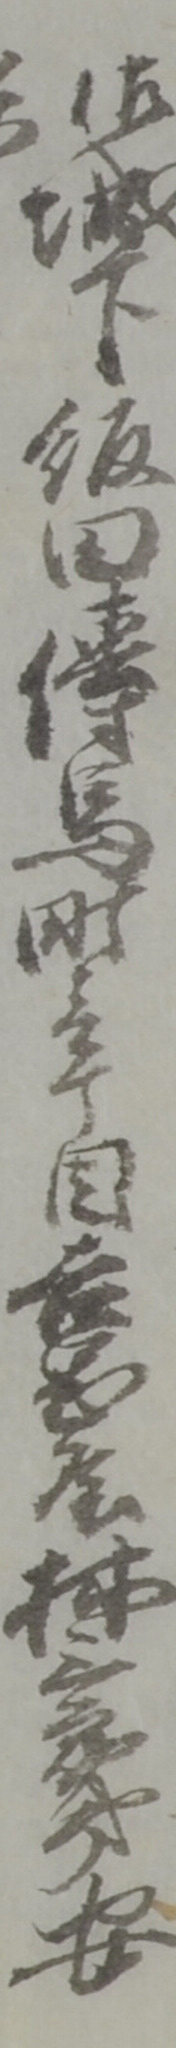御城下飯田傳馬町壱丁目吉岡屋柿三郎弟安
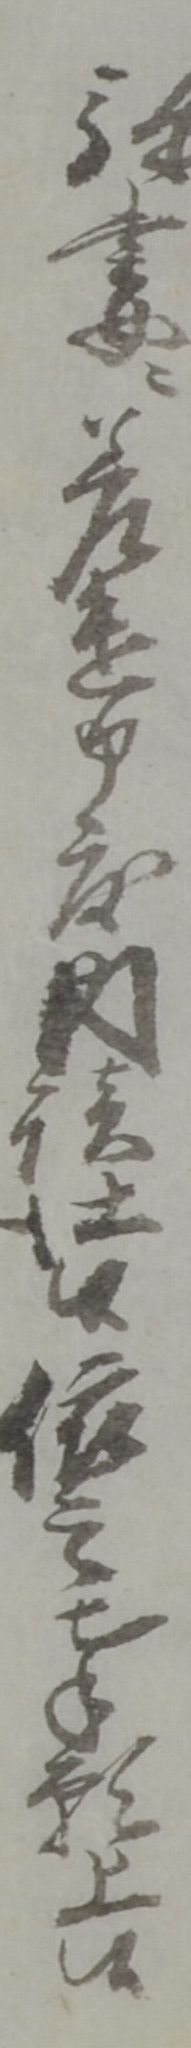弥妻ニ差遣申度内談仕候依之奉願上候
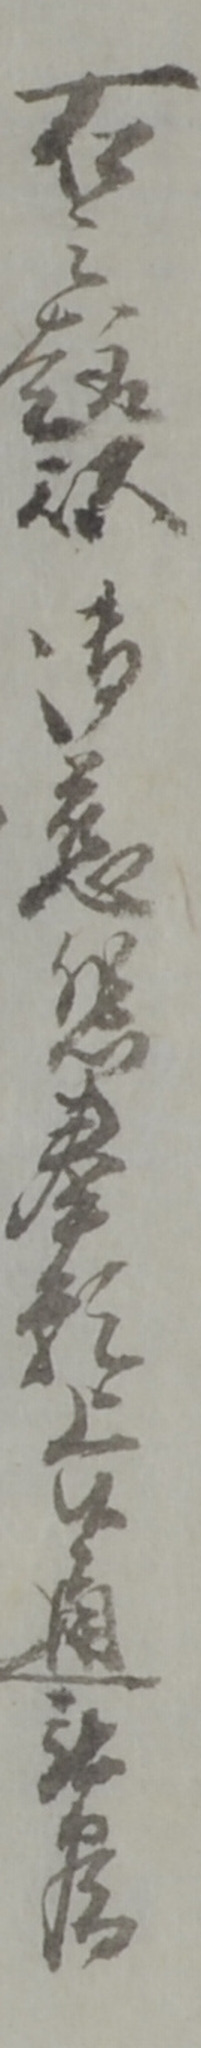右之趣以御慈悲奉願上候通被為仰付
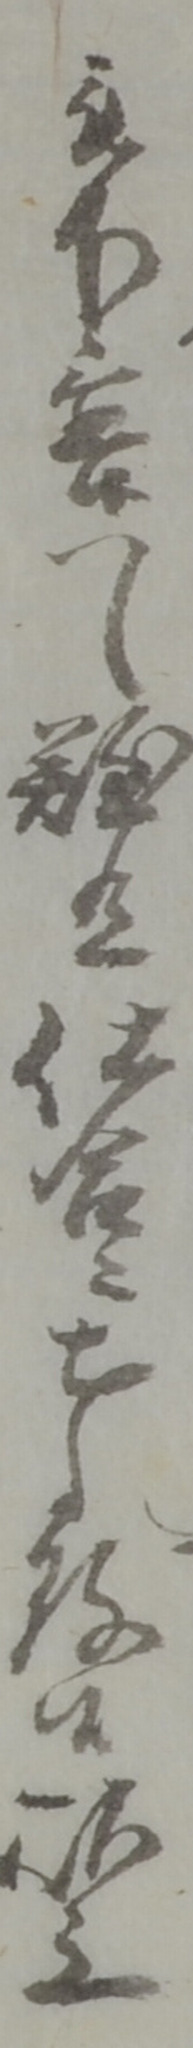被下置候ハヽ難有仕合奉存候以上
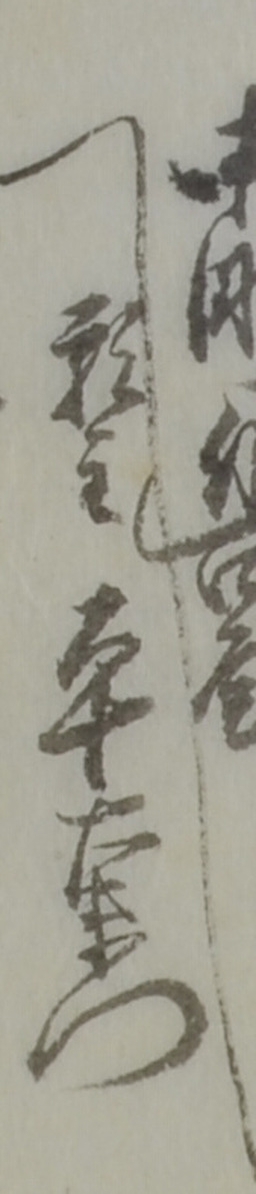二月願主平右衛門
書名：諸願書控簿
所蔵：伊那市立高遠町図書館・合同会社AMANE
